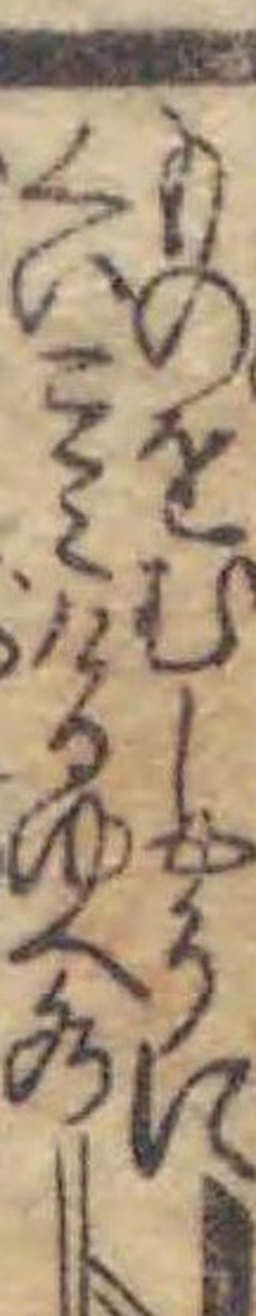くいこみけるゆへ水
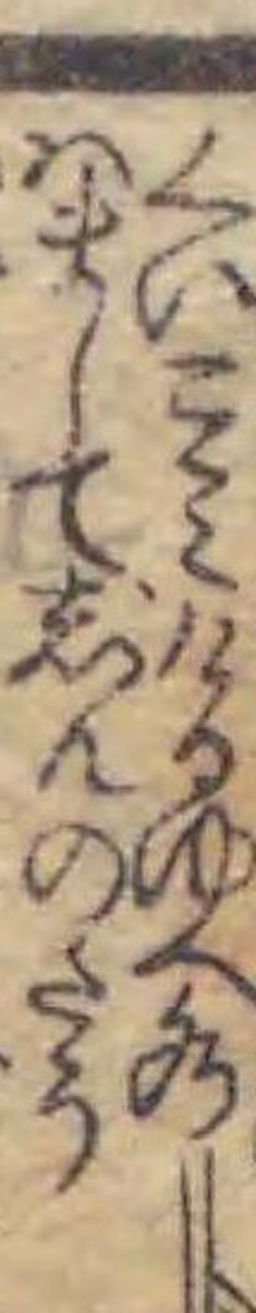はましてじんのさう
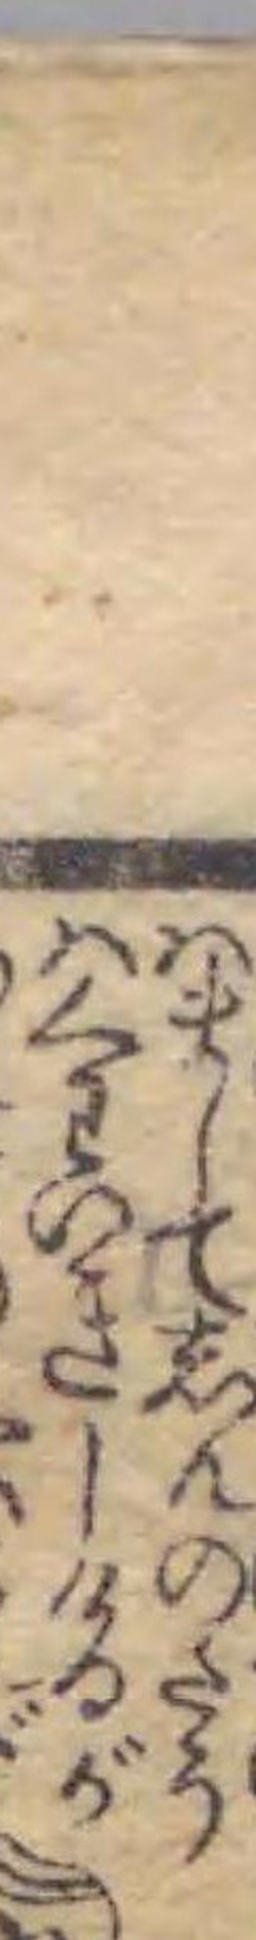はくわいきしけるが
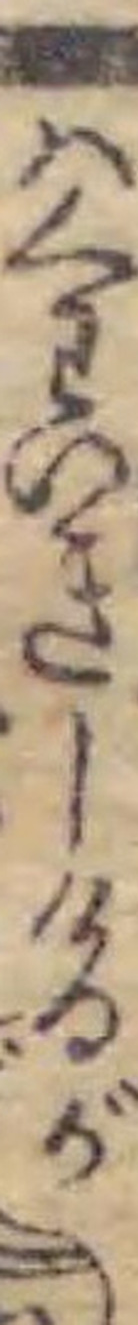はくわいきしけるが
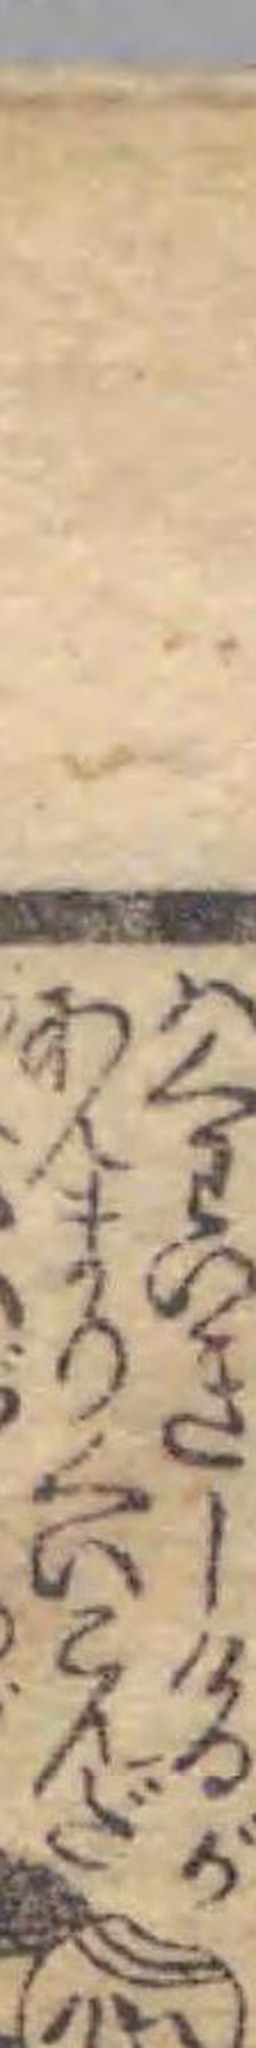あんまりくいこんだ
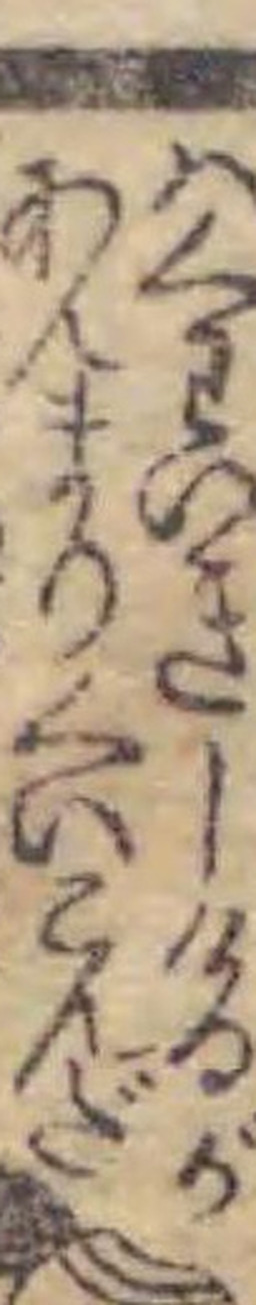あんまりくいこんだ
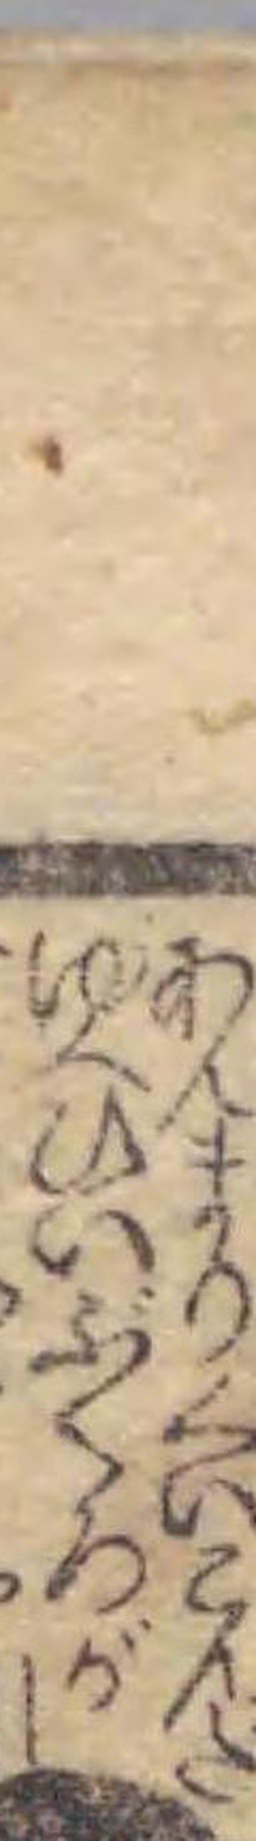ゆへひいぶくろが
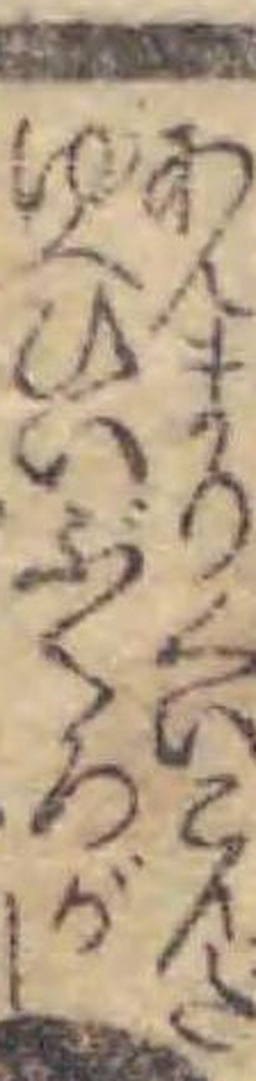ゆへひいぶくろが
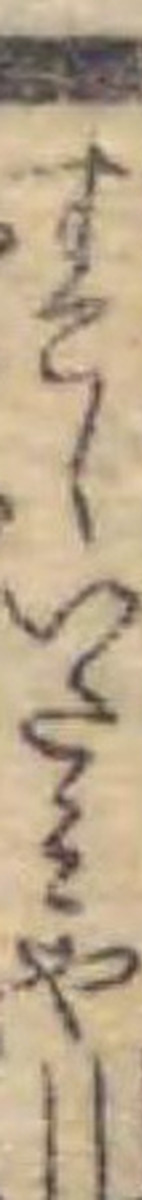すこしいたみや
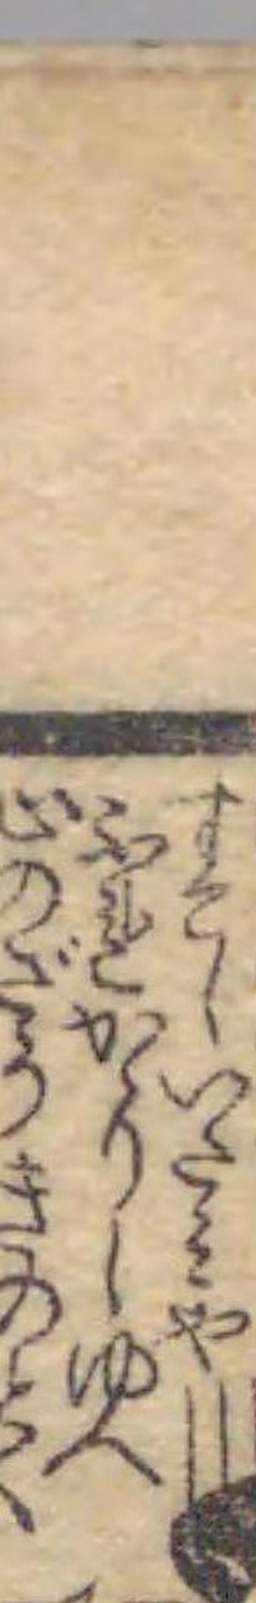ふれかゝりしゆへ
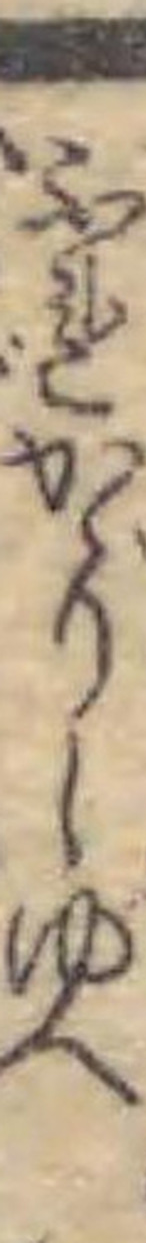ふれかゝりしゆへ
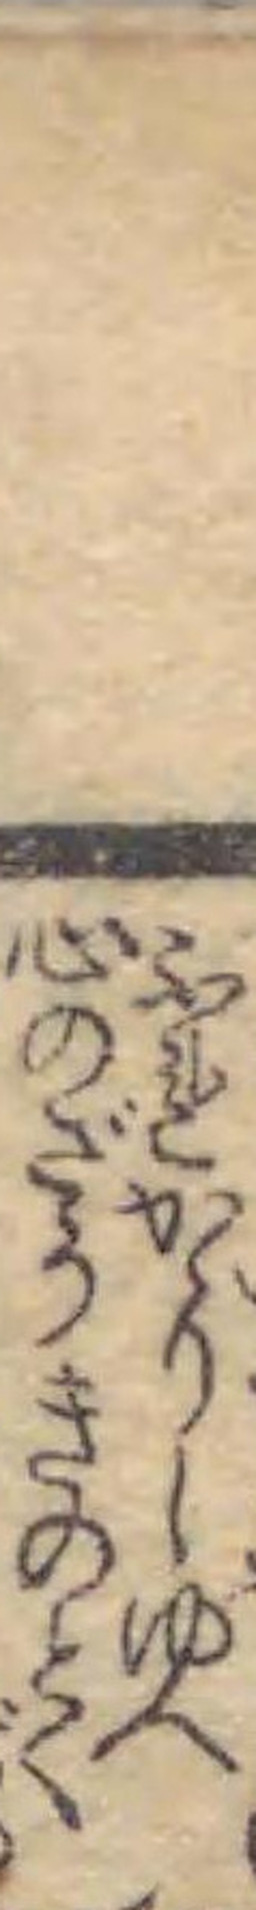心のざうきのとく
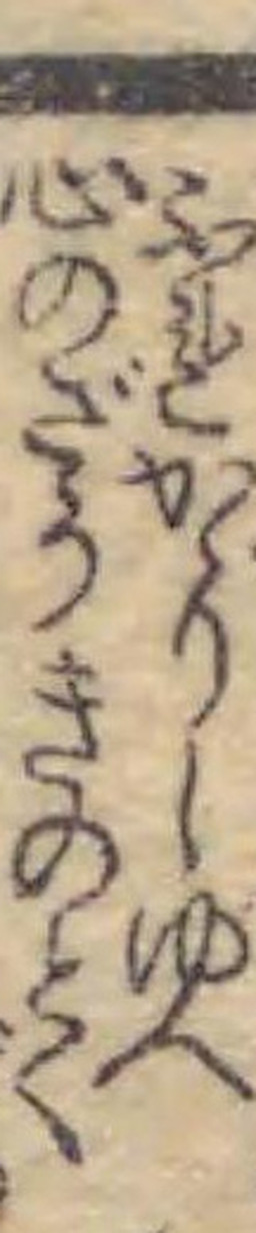心のざうきのとく
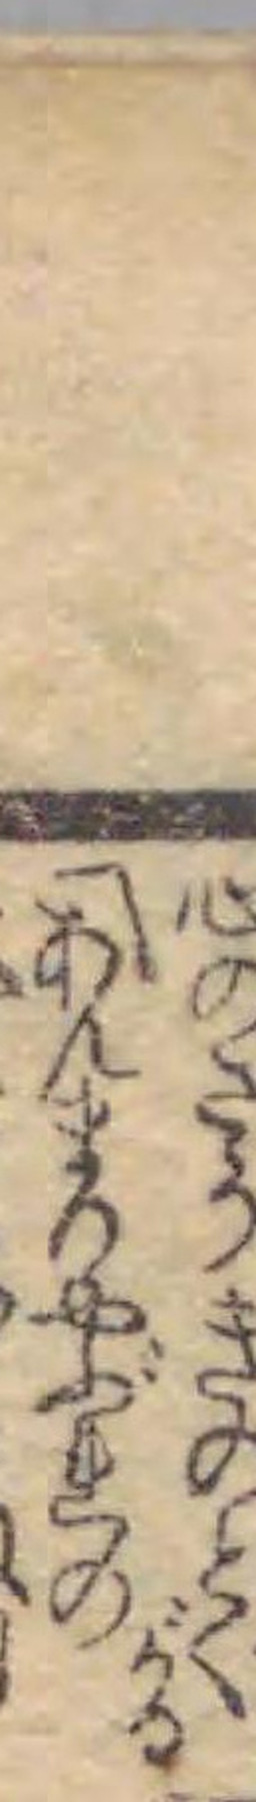〽あんまりやぶれの
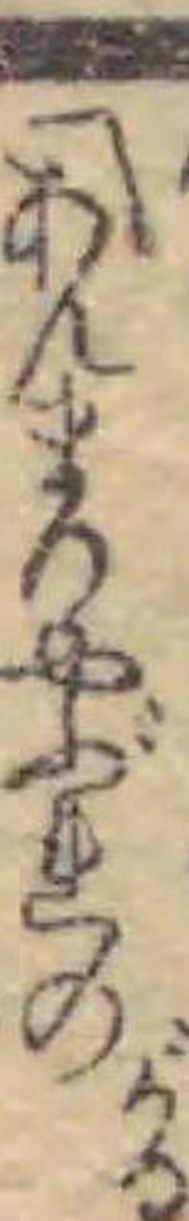〽あんまりやぶれの
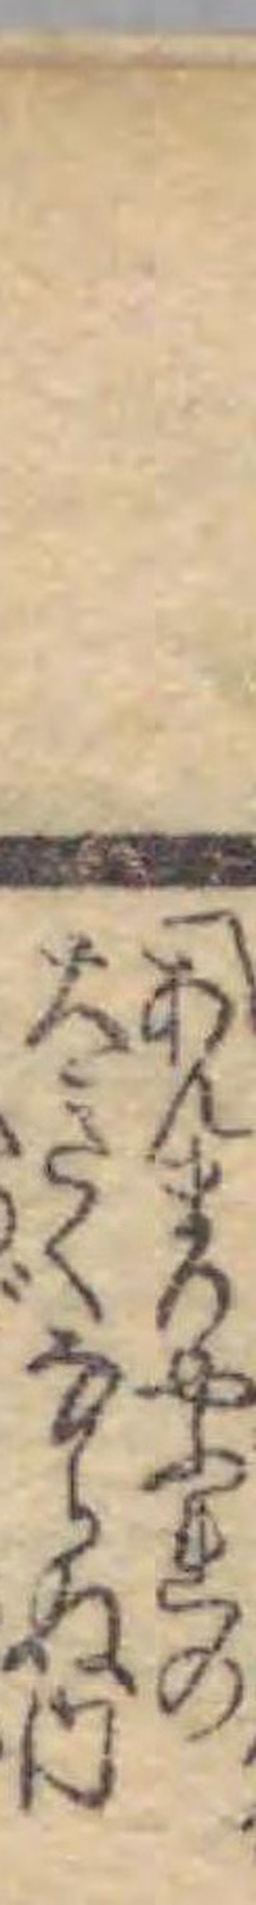大きくならぬ内
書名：十四傾城腹之内 : 3巻
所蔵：国立国会図書館 National Diet Library, JAPAN
